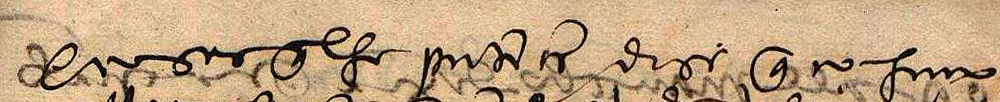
e cousas q̄ lhe pertēcē dise q̄ conheceo
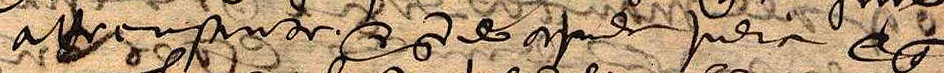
a Recusante ē sēdo aJnda Judia e q̄
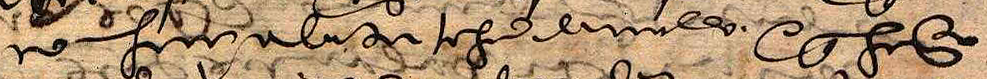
conhece o doutor Johā de mello. e q̄ he mto
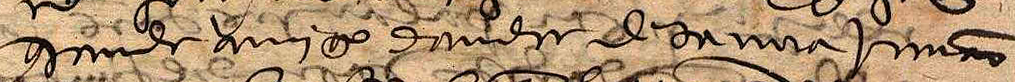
grande amjgo dandre de tauora Jrmão
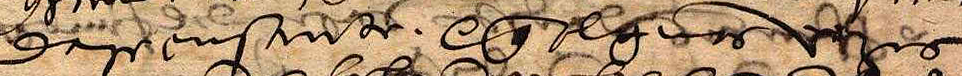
da recusante. e q̄ allguās vezes
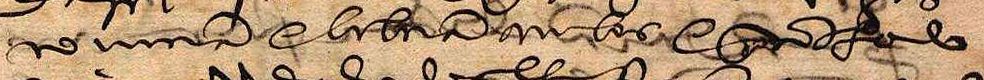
comerā e beberā ambos e q̄ cōthudo
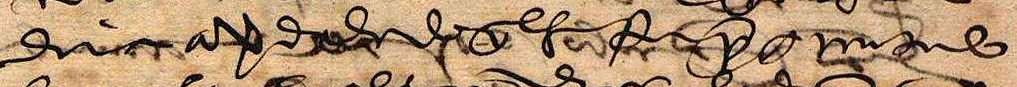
dira a ꝟdade de q̄ lhe for p̄guntado
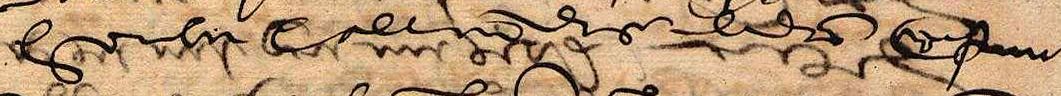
e souber e all nō dise do dtō custume
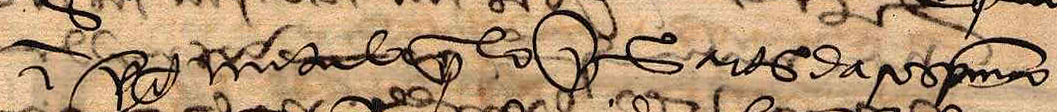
item p̄guntado p̄lo p̄mo arto da sospeição
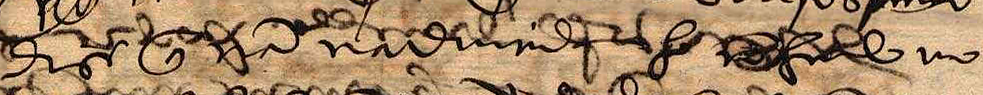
dise q̄ nā na duuida ho c̄otheudo no
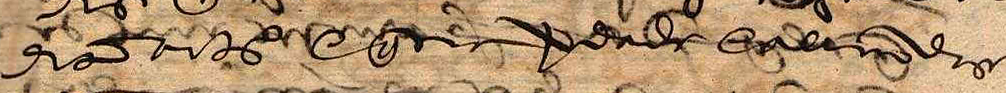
dito arto e q̄ era ꝟdade e all nō dise
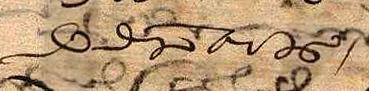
do dito arto /
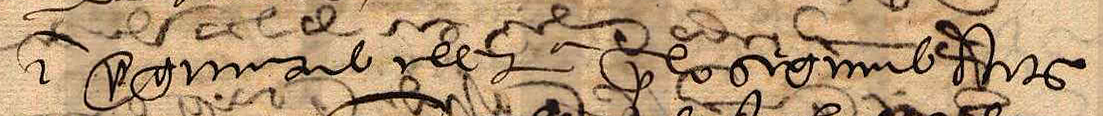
item p̄gumtado elle ta pl̄o ho segumdo Arto
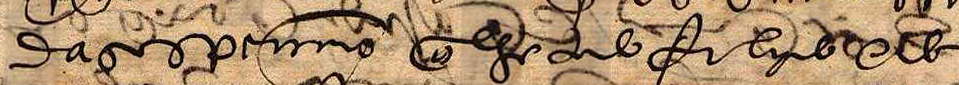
da sospeição q̄ lhe todo foi lydo e de
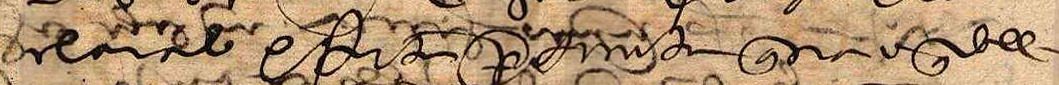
clarado e feita p̄gunta q̄ era o q̄ delle
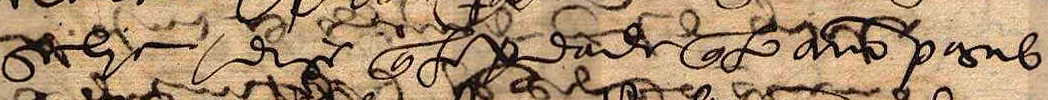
sabja / dise q̄ he ꝟdade q̄ ho an̄o pasado
